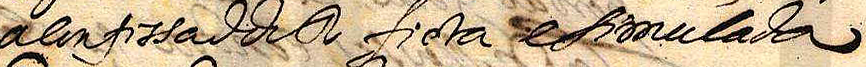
a confissaõ do R ficta e simulada
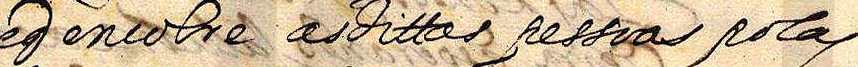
e q̄ encobre as dittas pessoas polas
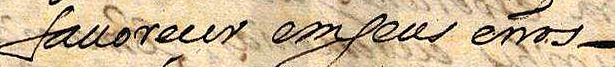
fauoreçer em seus erros —
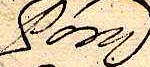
Porq̄
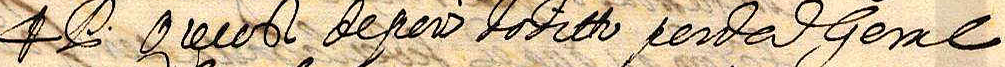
4 P. Que o R depois do ditto perdaõ Geral
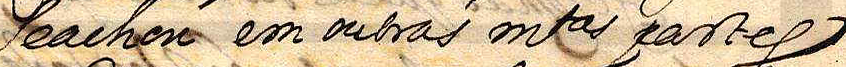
Se achou em outras mtas partes
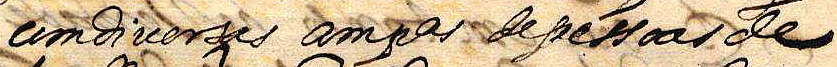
com diuersas compas de pessoas de
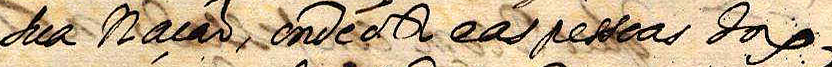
sua Naçaõ, onde o R e as pessoas das
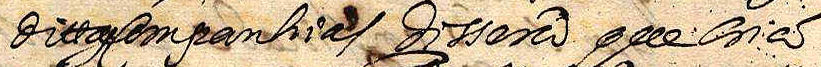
dittas Companhias disseraõ que criaõ
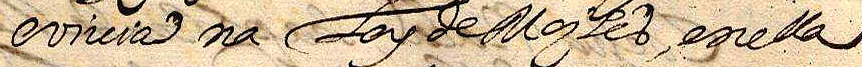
e viviaõ na Ley de Mojses, e nella
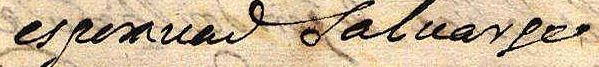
esperauaõ saluarse
